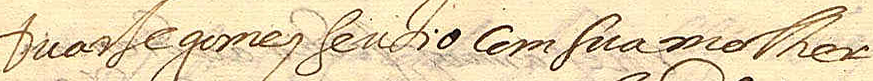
Duarte gomez seu tio com sua molher
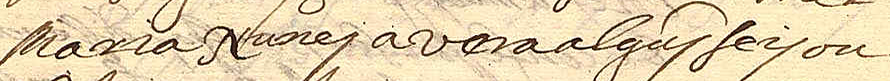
Maria Nunez avera algus̄ seis ou
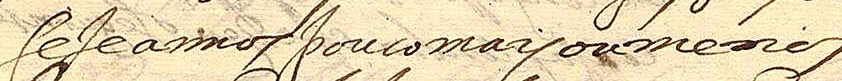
sete annos pouco mais ou menos
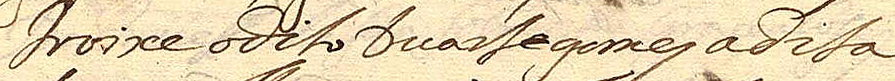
troixe o dito Duarte gomez a dita
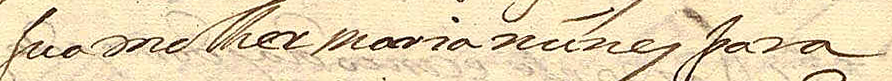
sua molher maria nunez para
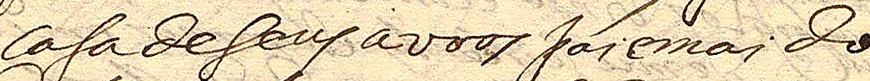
casa de seus avoos pai e mai do
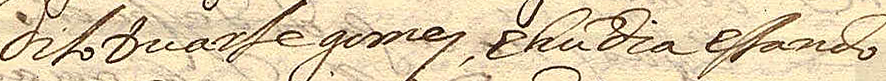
dito Duarte gomez, e hū dia estando
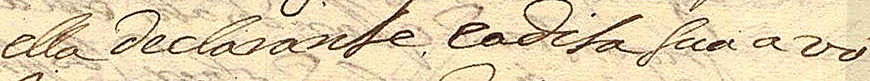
ella declarante, e a dita sua avó
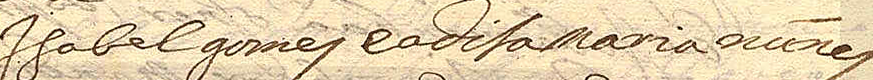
Jsabel gomez e a dita Maria nun̄ez
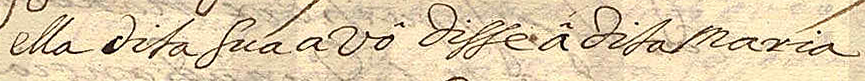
ella dita sua avô disse â dita Maria
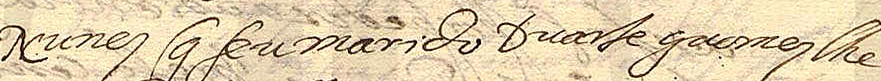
Nunez q̄ seu marido Duarte guomez lhe
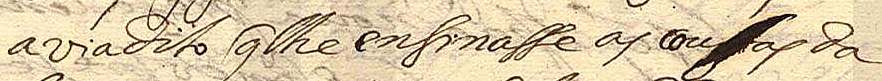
avia dito q̄ lhe ensinasse as cousas da
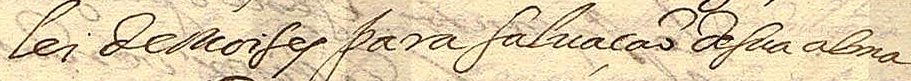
lei de Moises para saluaçaõ de sua alma
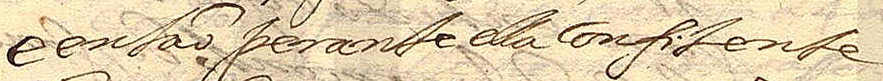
e entaõ perante ella confitente
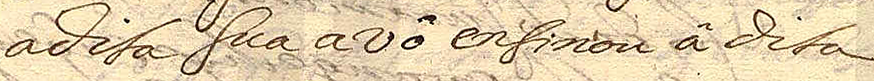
a dita sua avô ensinou â dita
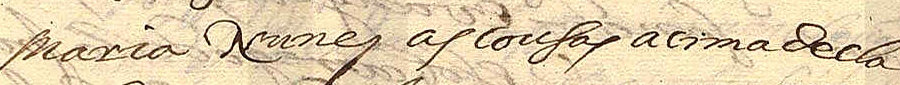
Maria Nunez as cousas acima decla
